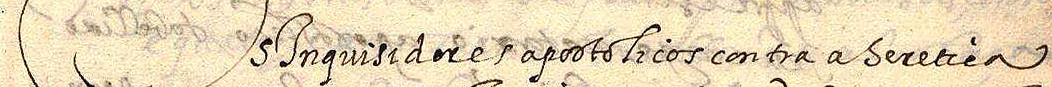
Os Inquisidores apostolicos contra a heretica
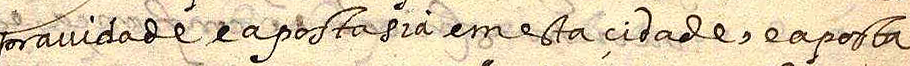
prauidade e apostasia em esta çidade, e aposta
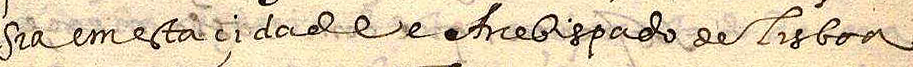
sia em esta çidade e Arcebispado de Lisboa
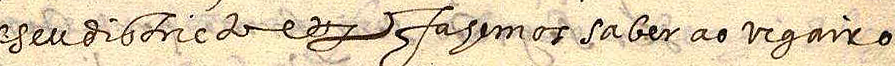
e seu districto etc̄ꝭ Fazemos saber ao vigairo
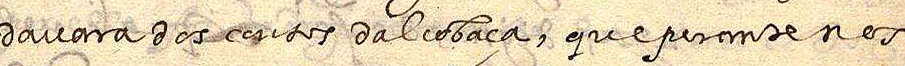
da uara dos coutos dalcobaça, que perante nos
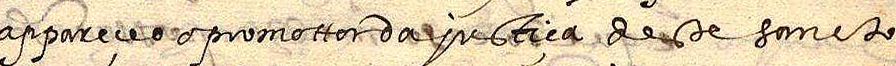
appareçeo o promottor da justiça deste sancto
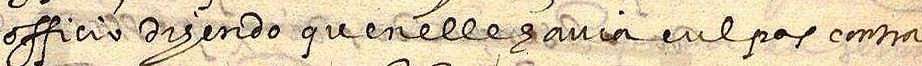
officio dizendo que nelle hauia culpas contra
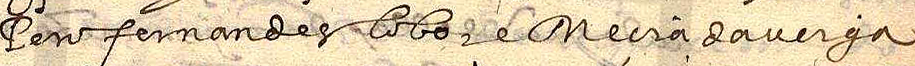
Pero fernandes lobo, e Meçia da ueiga
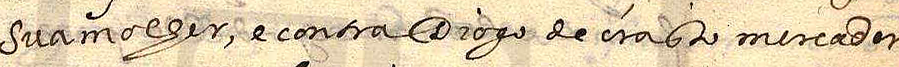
sua molher, e contra Diogo de crasto mercador
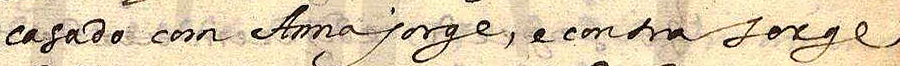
casado com Anna jorge, e contra Jorge
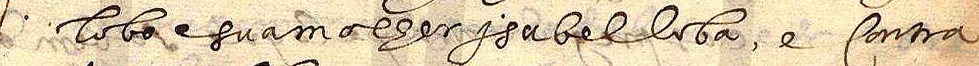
lobo e sua molher Jsabel loba, e Contra
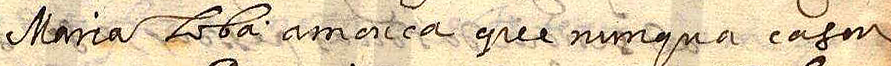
Maria Loba a mouca que nunqua casou
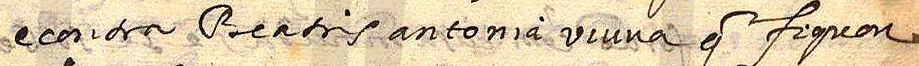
e contra Beatris antonia viuua q̄ fiquou
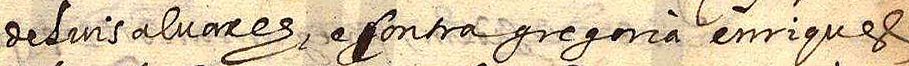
de Luis aluares, e Contra gregoria enriques
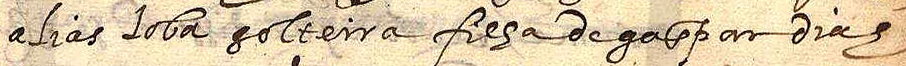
alias Loba solteira filha de gaspar dias
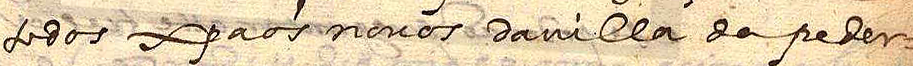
todos xpaos̄ nouos da uilla da peder
